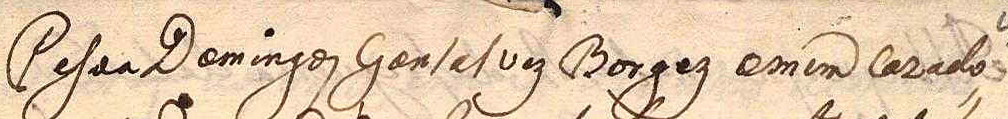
Pesoa Domingos Gonsalvez Borges omem cazado,
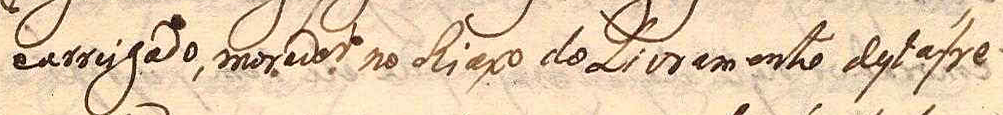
e arreigado, morador no Riaxo do Livramento desta fre
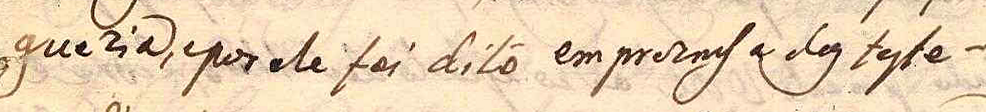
guezia, e por ele foi dito em prezemsa dos teste
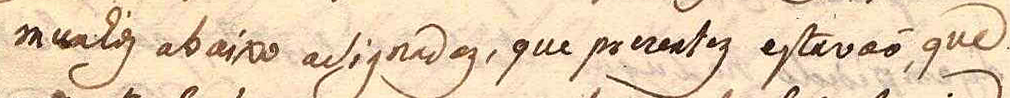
munhos abaixo asignadoz, que prezentez estavaõ, que
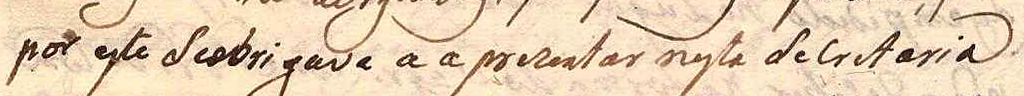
por este Se obrigava a aprezentar nesta secretaria
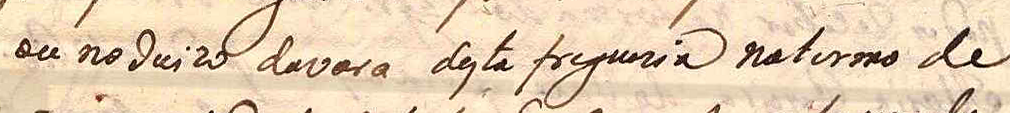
ou no Iuizo da vara desta freguezia no termo de
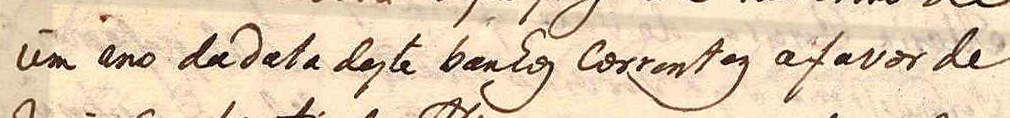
um ano da data deste banhos correntez a favor de
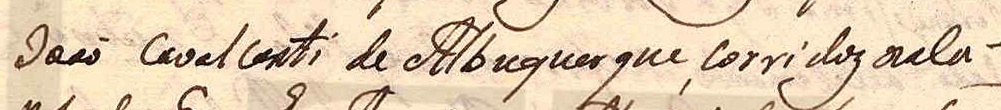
Ioaõ Cavalcanti de Albuquerque, corridos na Ca
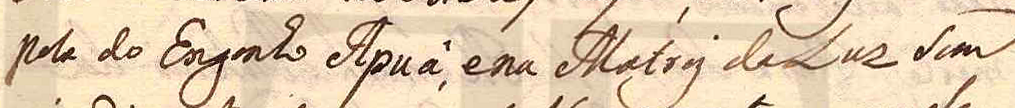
pela do Engenho Apuâ, e na Matriz da Luz sem
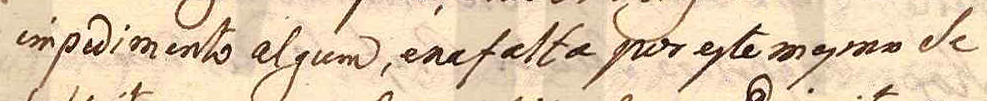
impedimento algum, e na falta por este mesmo Se
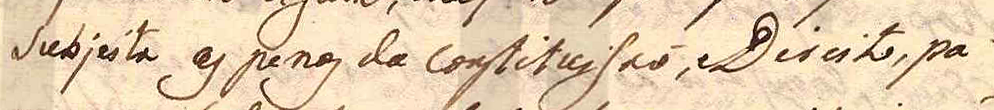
subjeita as penas da constituisaõ, e Direito, pa
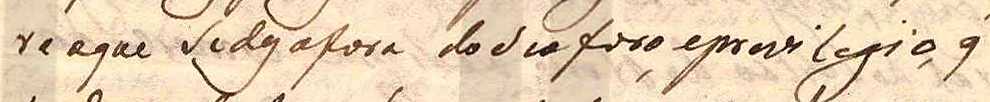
ra o que se desafora do seo foro, e previlegio, q̄
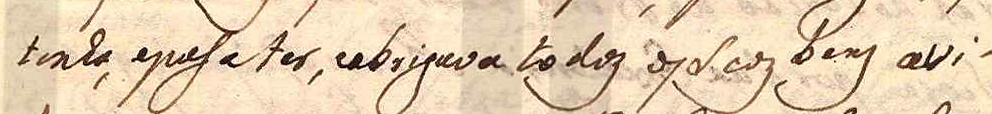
tenha, e posa ter, e obrigava todoz os seoz bens avi
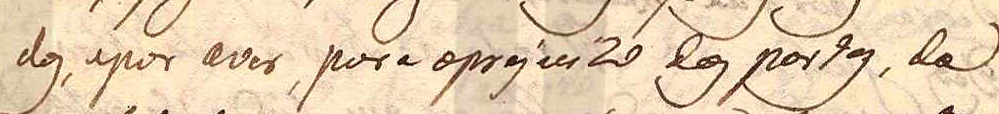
dos, e por aver, para o prejuizo dos portoz, do
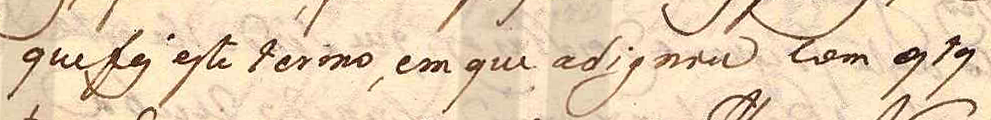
que fis este termo, em que asignou com os tes
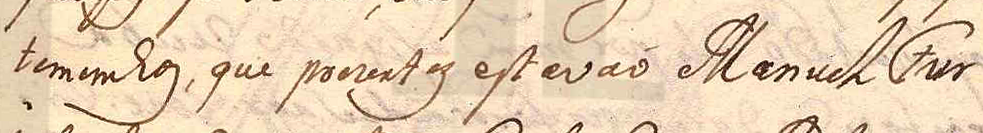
temunhos, que prezentez estavaõ Manuel Fur
